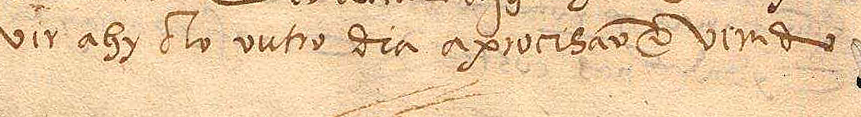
vir ahy Ao outro dia a procisão e vimdo
